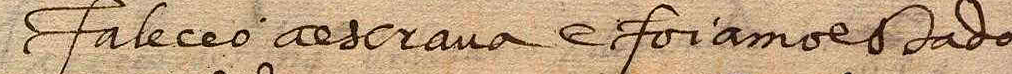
faleceo a escraua e foi amoestada
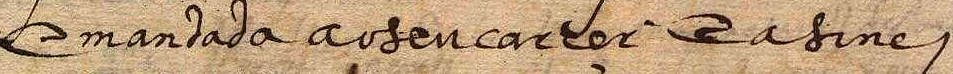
e mandada ao seu carçer e asinej
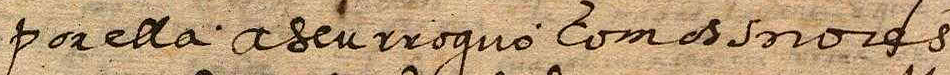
por ella a seu rroguo com os snores̅
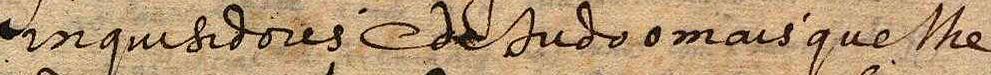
inquisidores e de tudo o mais que lhe
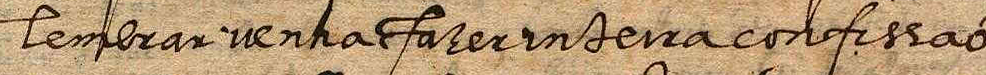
lembrar uenha fazer inteira confissaõ
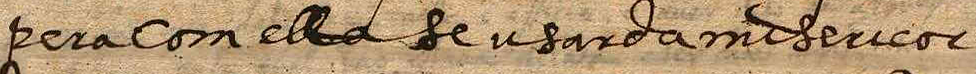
pera com ella se usar da misericor
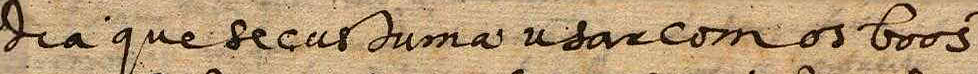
dia que se custuma usar com os boos̄
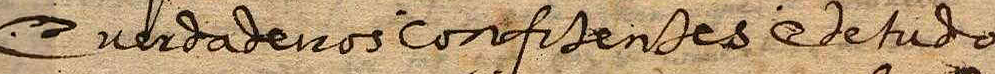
e uerdadeiros confitentes e de tudo
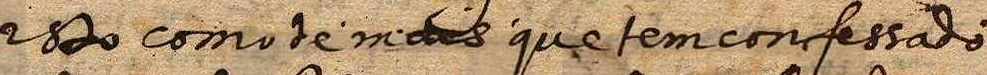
isto como de mais que tem confessado
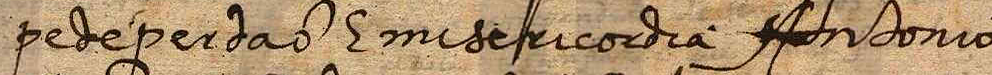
pede perdaõ E misericordia Antonio
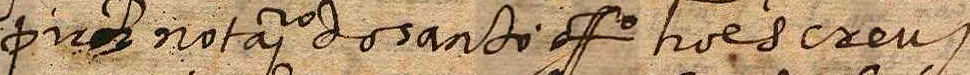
pire̅z notajro do santo offo ho escreuj
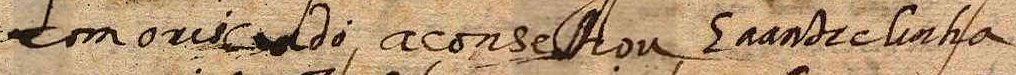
com o riscado, aconselhou, E a antrelinha
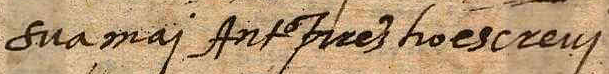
sua maj Anto pirez ho escreuj
